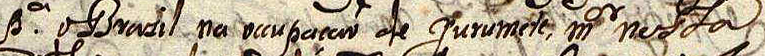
p.a o Brazil na occupaçaõ de gurumete, mor nesta
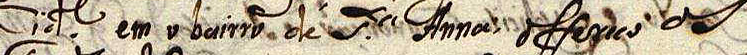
Cid̄.e em o bairro de S.ta Anna offereco os
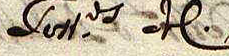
Test.os de.
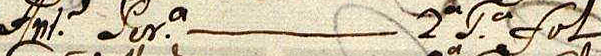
Ant.o Per.a ‒ 2a T.a foL
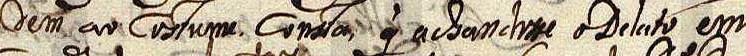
rem ao Costume. Consta, q̄ achandosse o Delato em
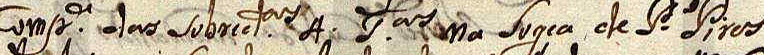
Comp.a das sobred̄.as 4. T.as na logea de P.o Pires
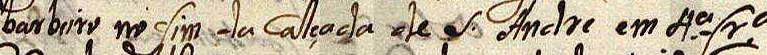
barbeiro no fim da Calçada de S. Andre em 4.a fr.a
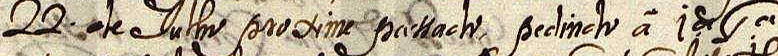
22. de Iulho proxime passado, pedindo à i.a T.a
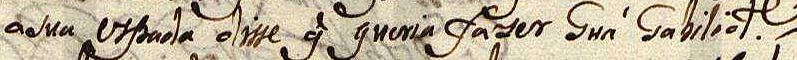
a sua espada disse q̄ queria fazer huā habilid̄.e
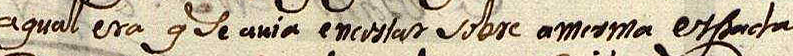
a qual era q̄ se auia encostar sobre a mesma espada
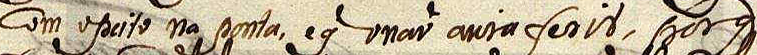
Com o peito na ponta, e q̄ o naõ auia ferir, porq̄
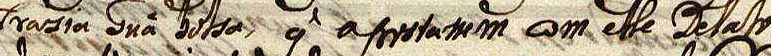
trazia huā bolsa, q̄ apostassem com elle Delato
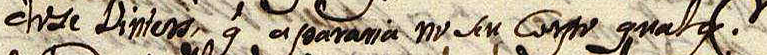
doze Vinteis, q̄ apararia no seu Corpo qualq.r
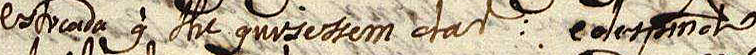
estocada q̄ lhe quisessem dar: e despindo
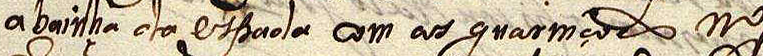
a bainha da espada com as guarnições no
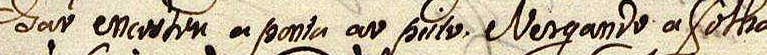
chaõ encostou a ponta ao peito. e Vergando a folha
